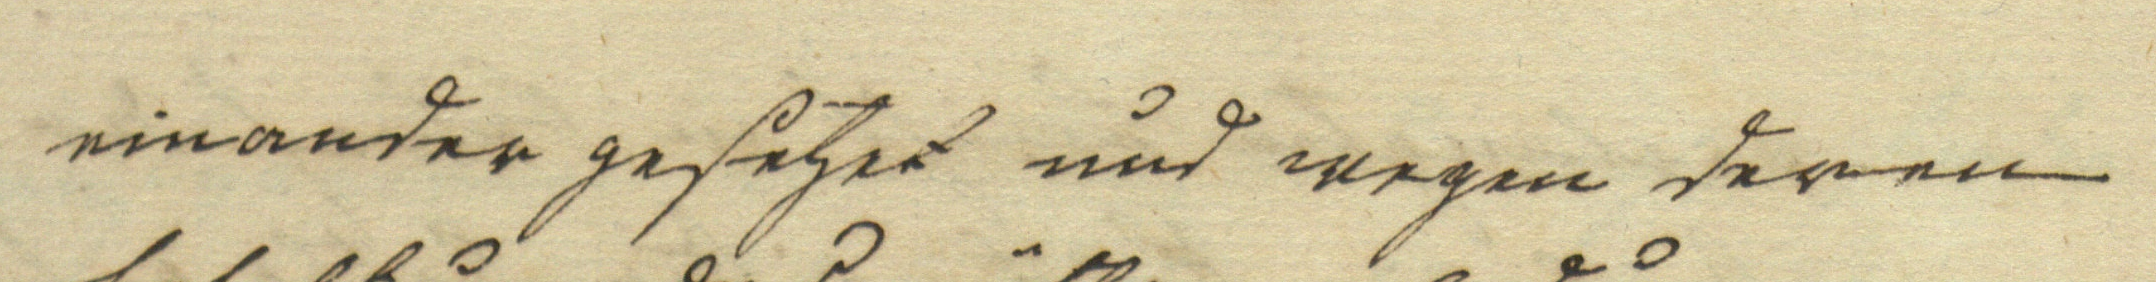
einander gesetzet und wegen deren
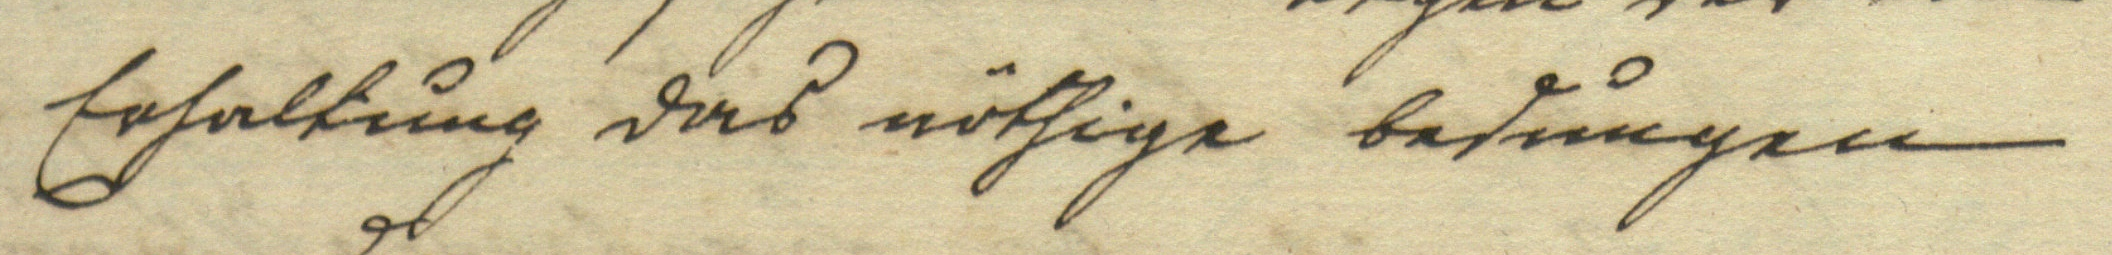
Erhaltung das nöthige bedungen
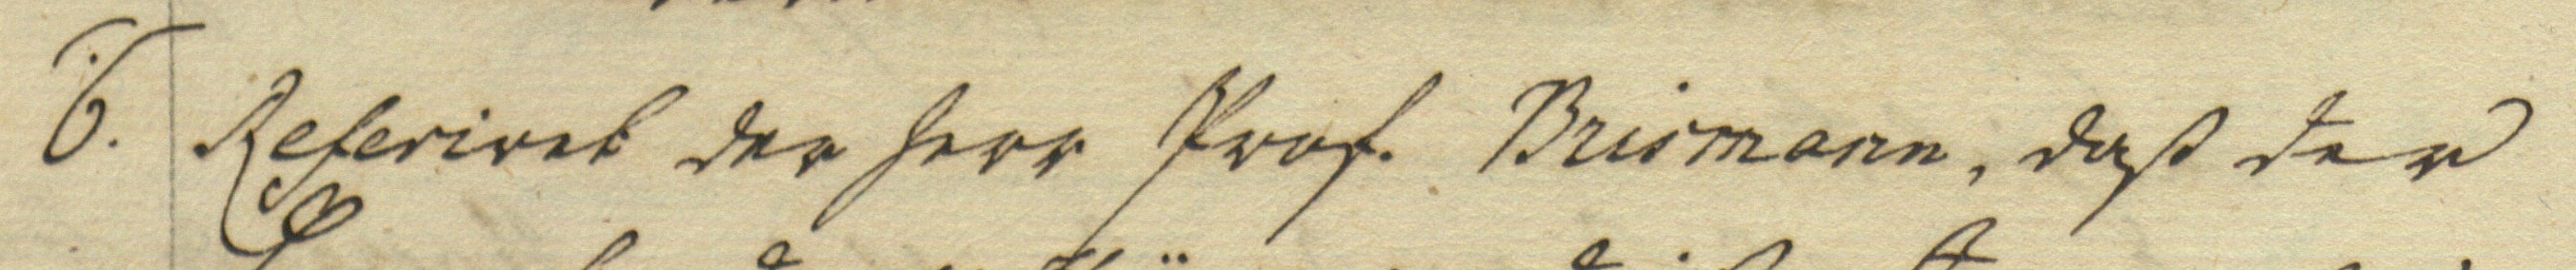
6. Referiret der Herr Prof. Brismann, daß der
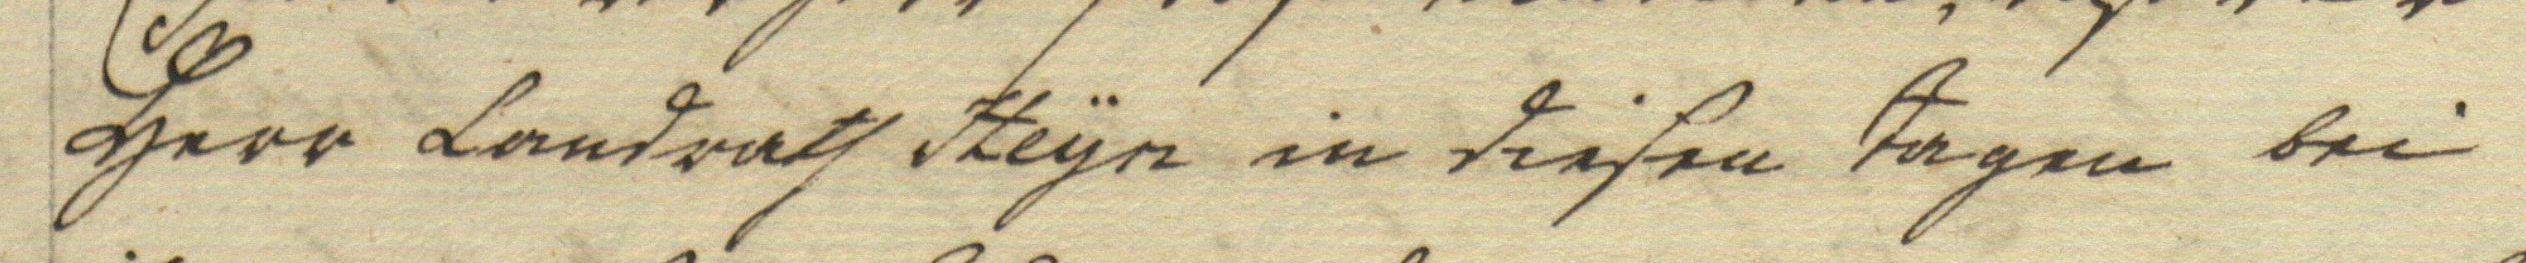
Herr Landrath Heÿn in diesen Tagen bei
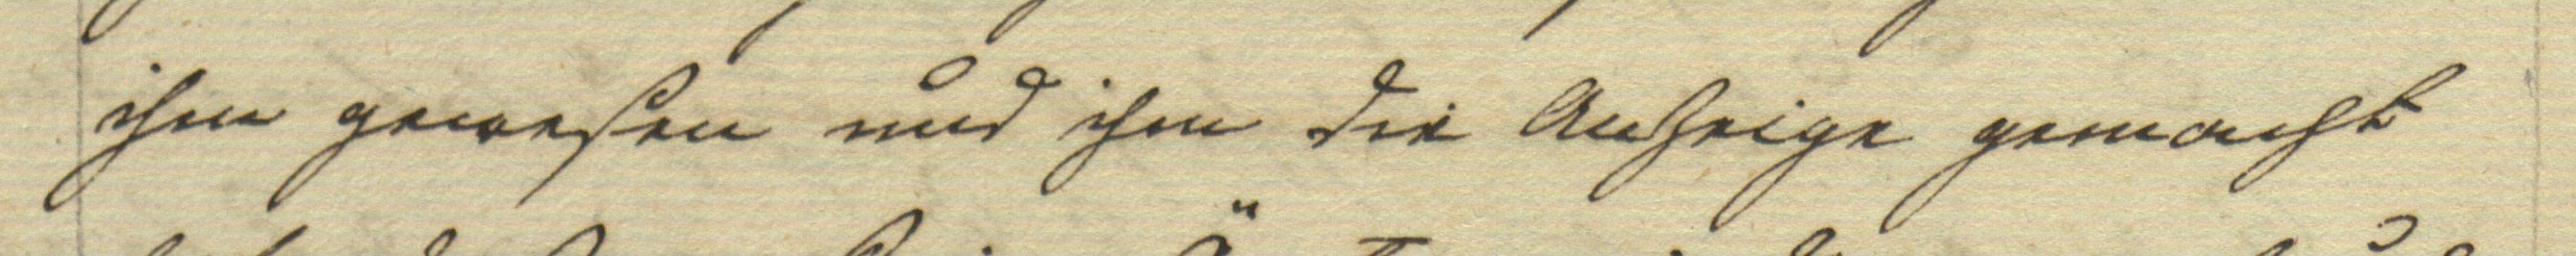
ihm gewesen und ihm die Anzeige gemacht
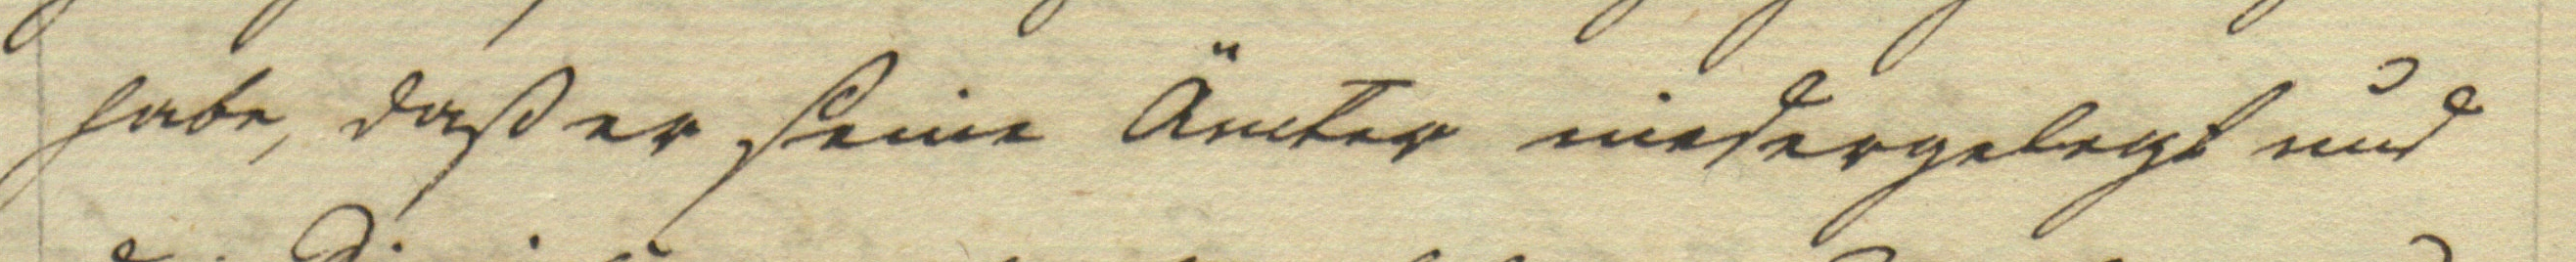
habe, daß er seine Ämter niedergelegt und
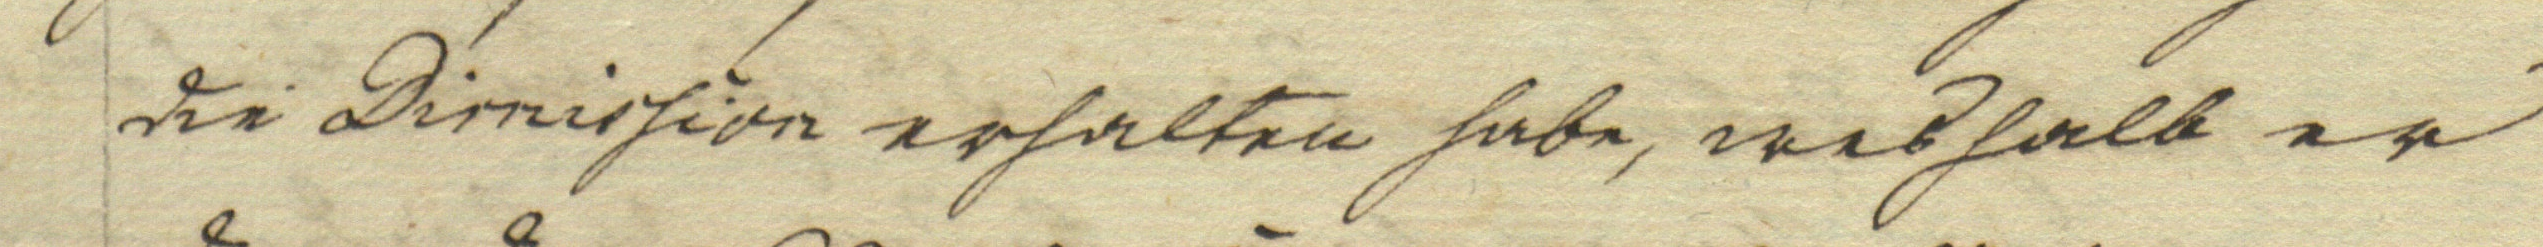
die Dimission erhalten habe, weshalb er
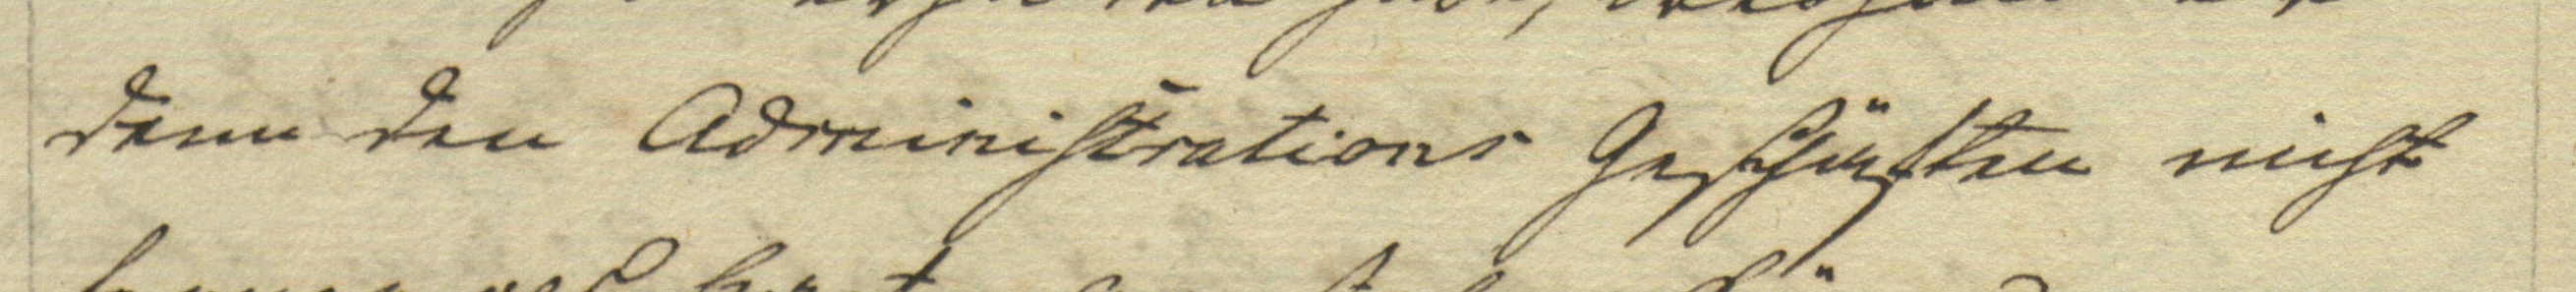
denn den Administrations Geschäften nicht
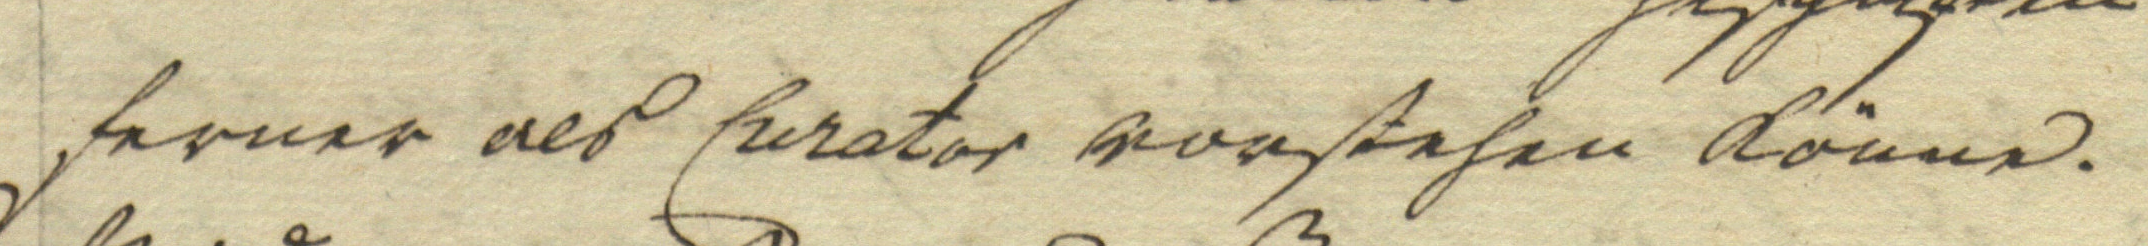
ferner als Curator vorstehen könne.
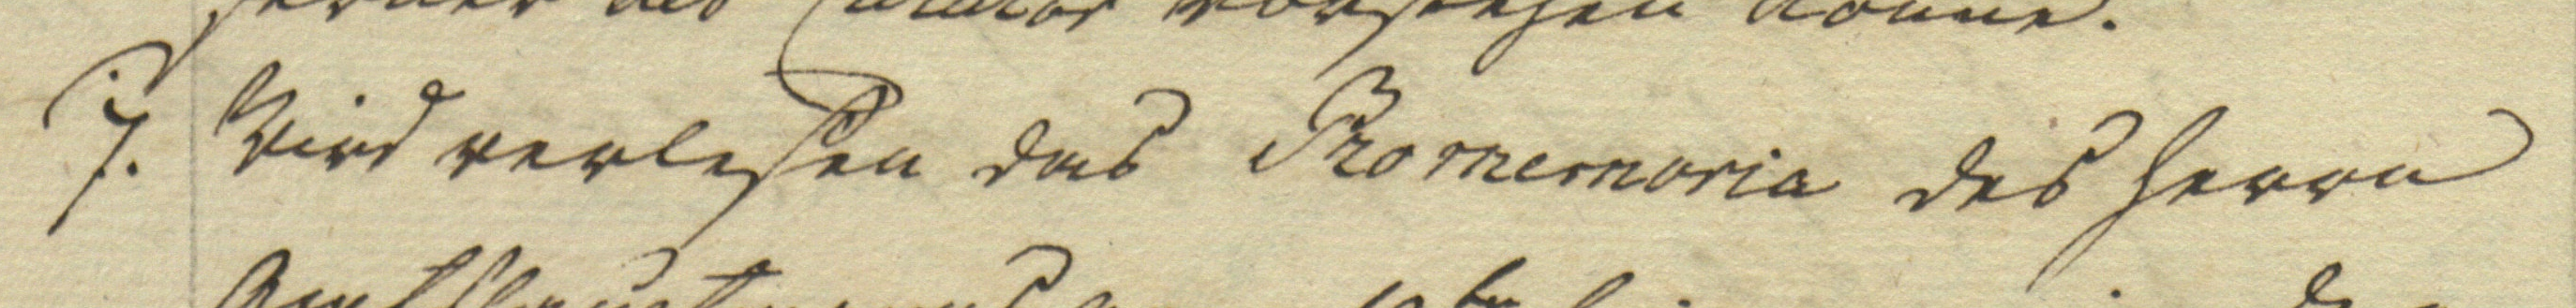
7. Wird verlesen das Promemoria des Herrn
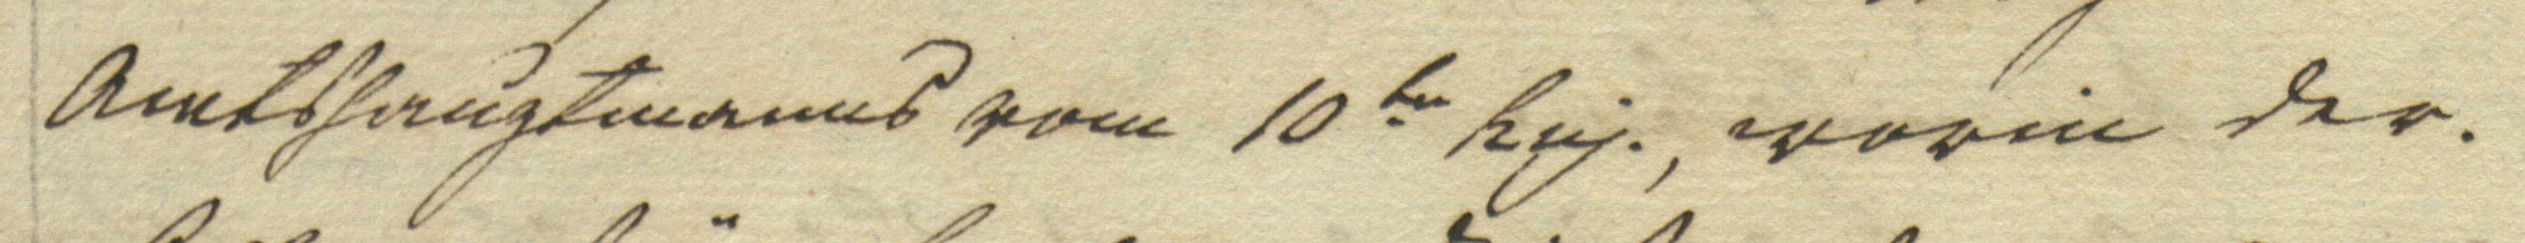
Amtshauptmanns vom 10 t huj., worin der¬
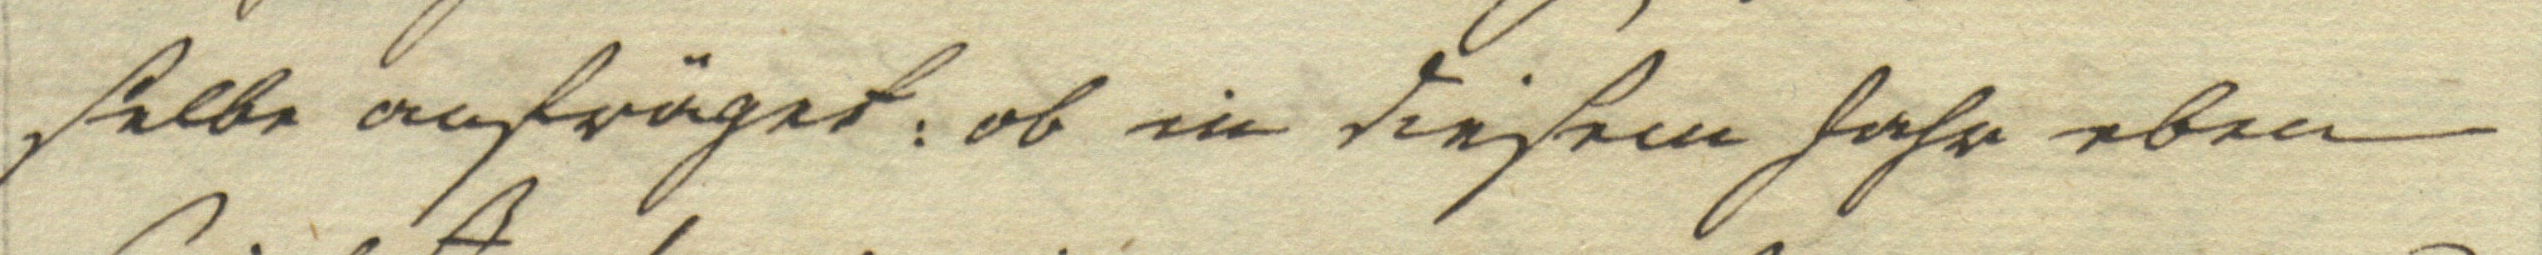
selbe anfräget: ob in diesem Jahr eben
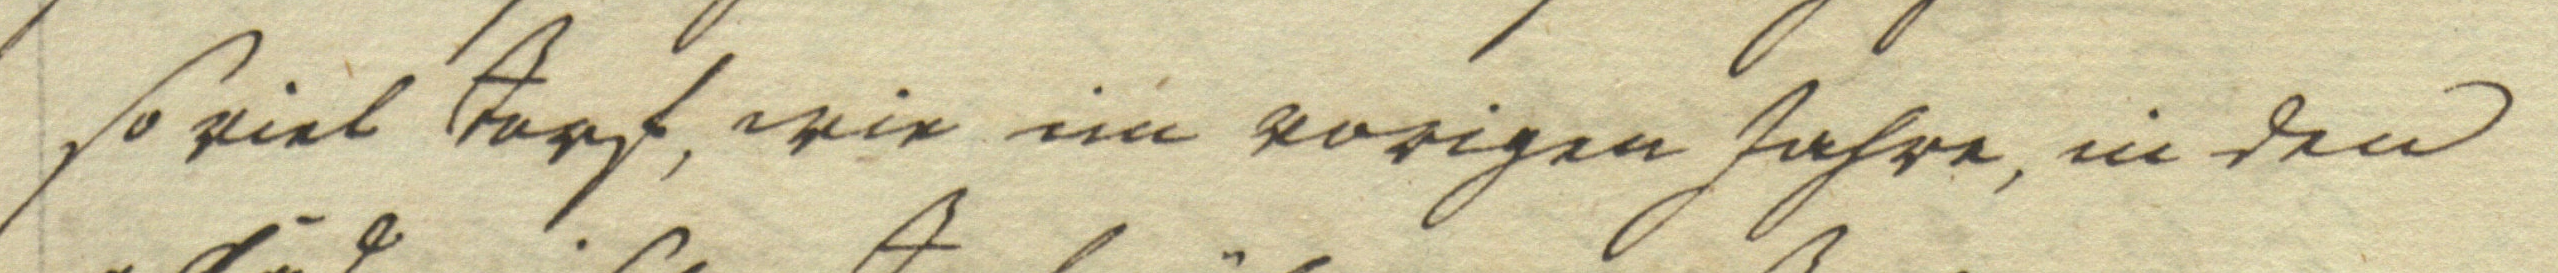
so viel Torf, wie im vorigen Jahre, in den
